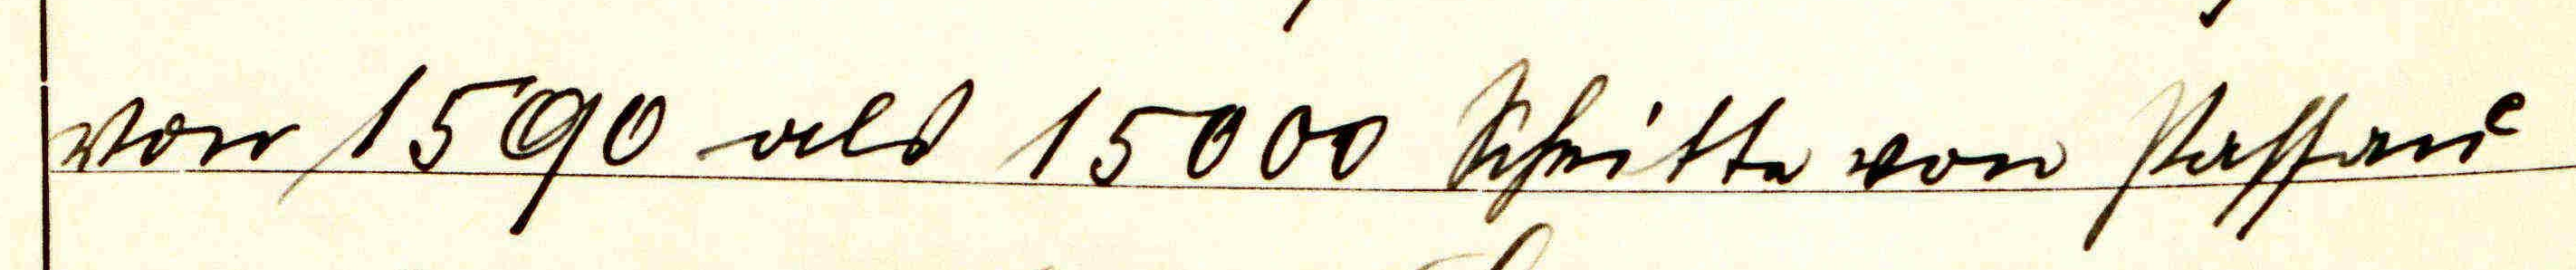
von 1590 als 15000 Schritte von Passau
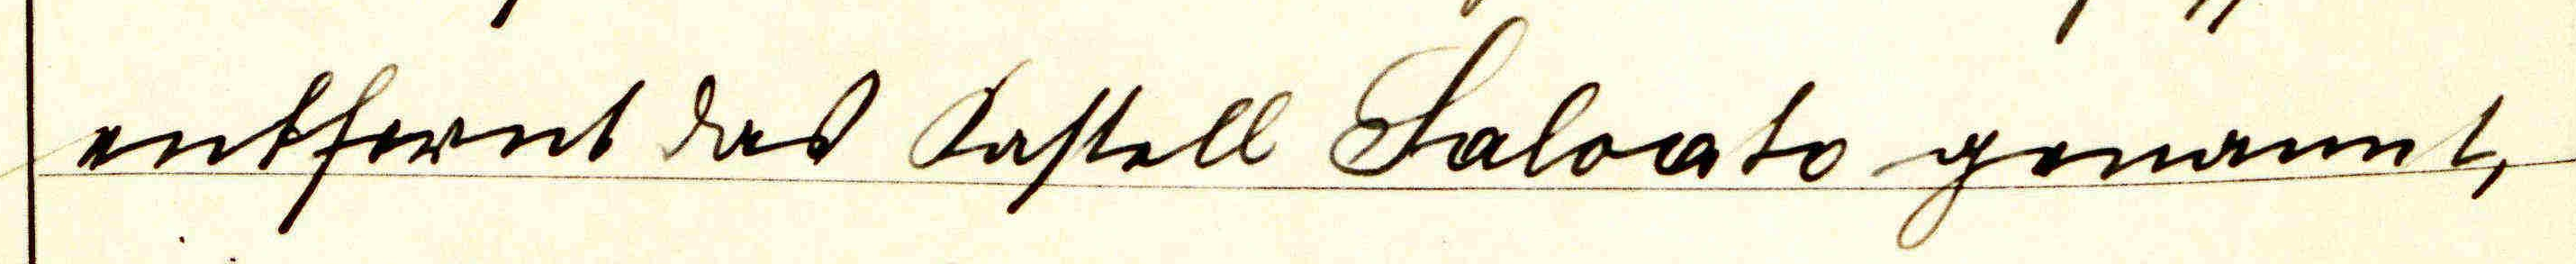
entfernt das Kastell Saloato genannt,
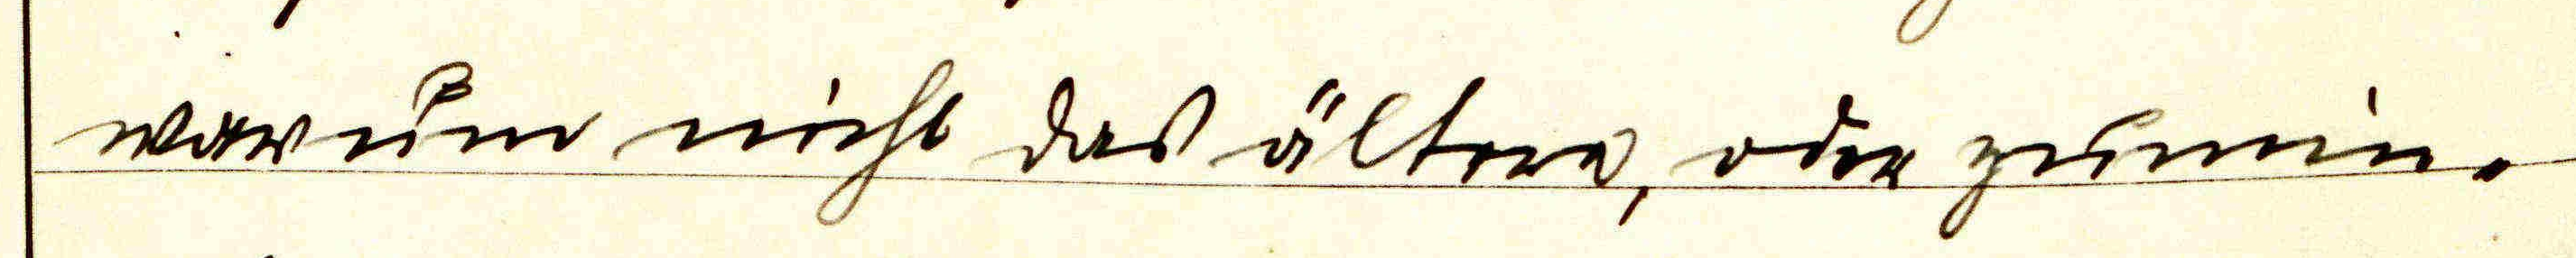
warum nicht das ältere, oder zumin-
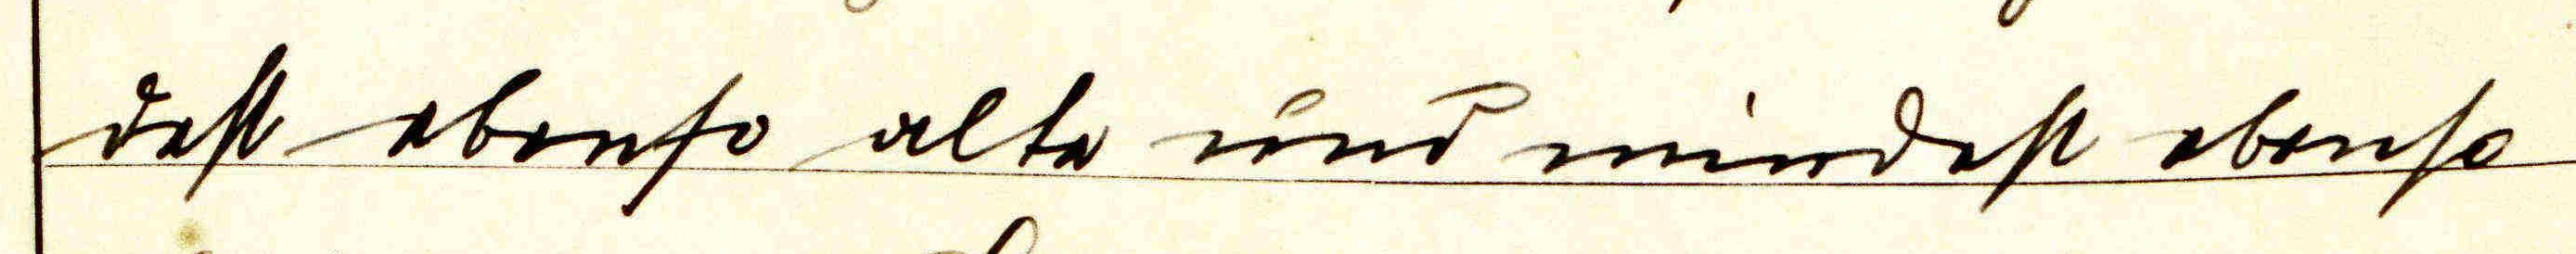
dest ebenso alte und mindest ebenso
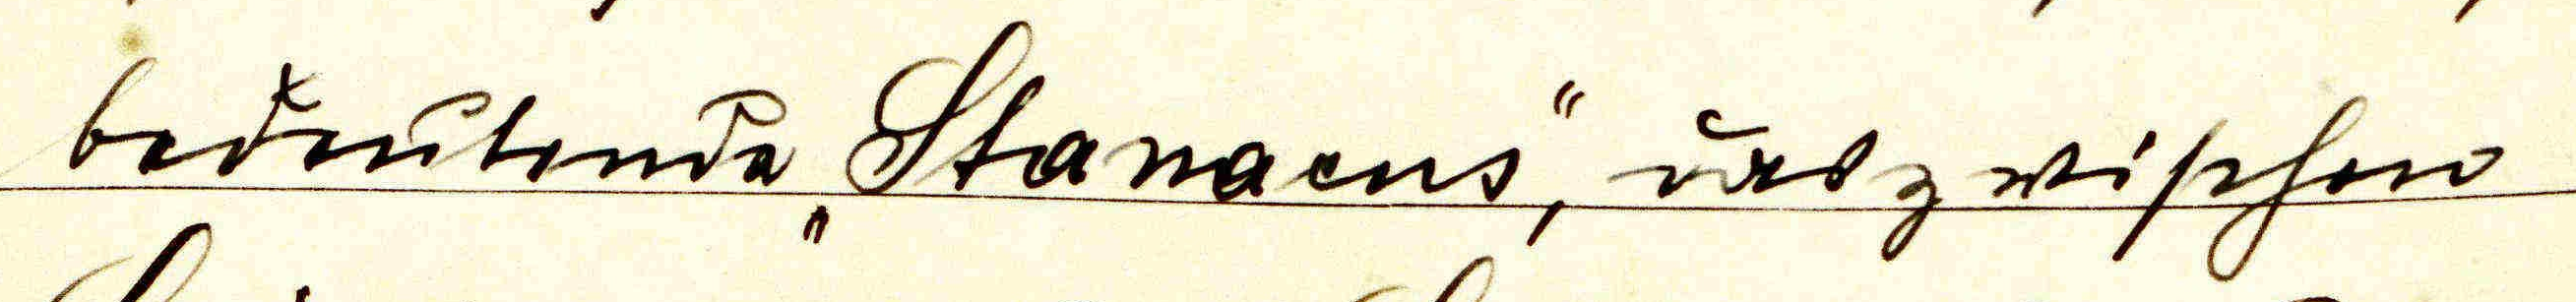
bedeutende „Stanacus“, das zwischen
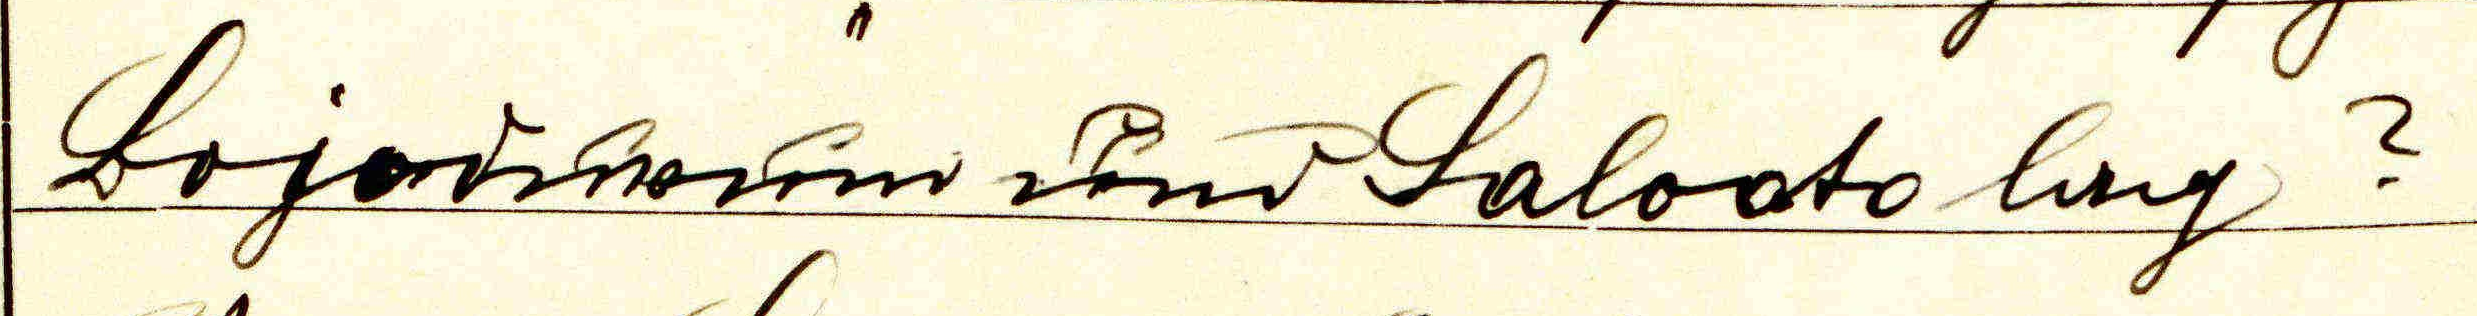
Bojodurum und Saloato lag?
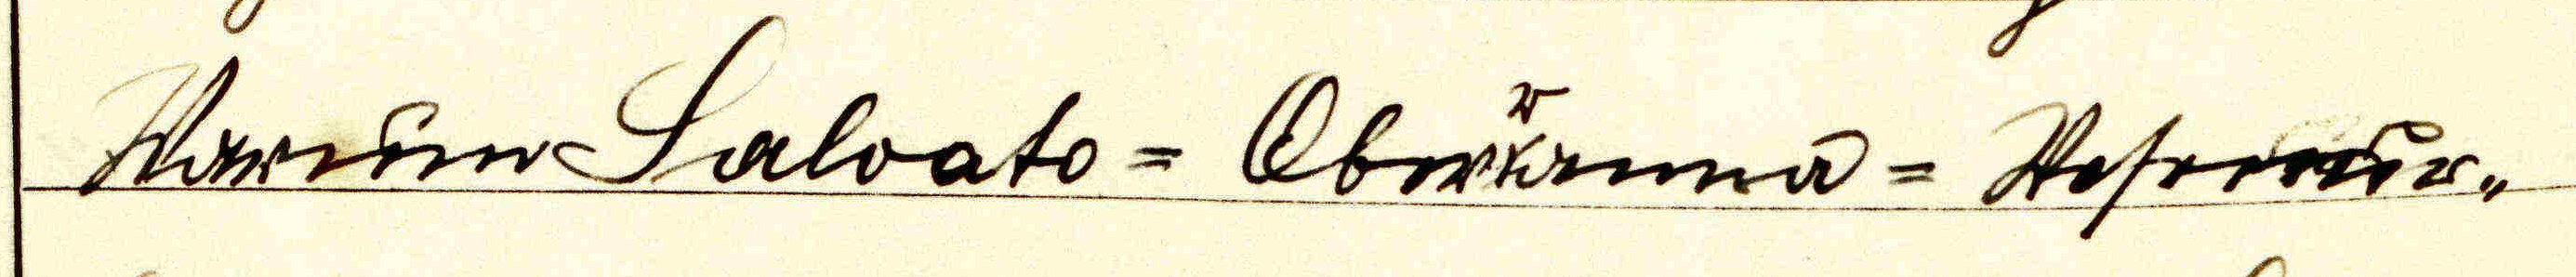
Warum Saloato = Oberrranna = Wesenur-
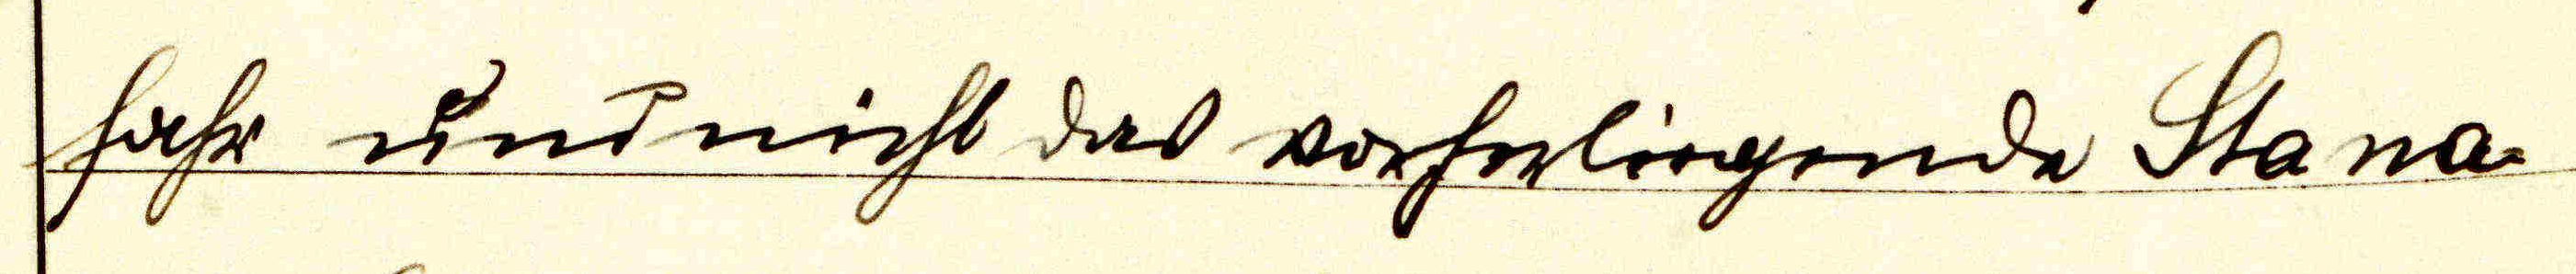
fahr und nicht das vorherliegende Stana-
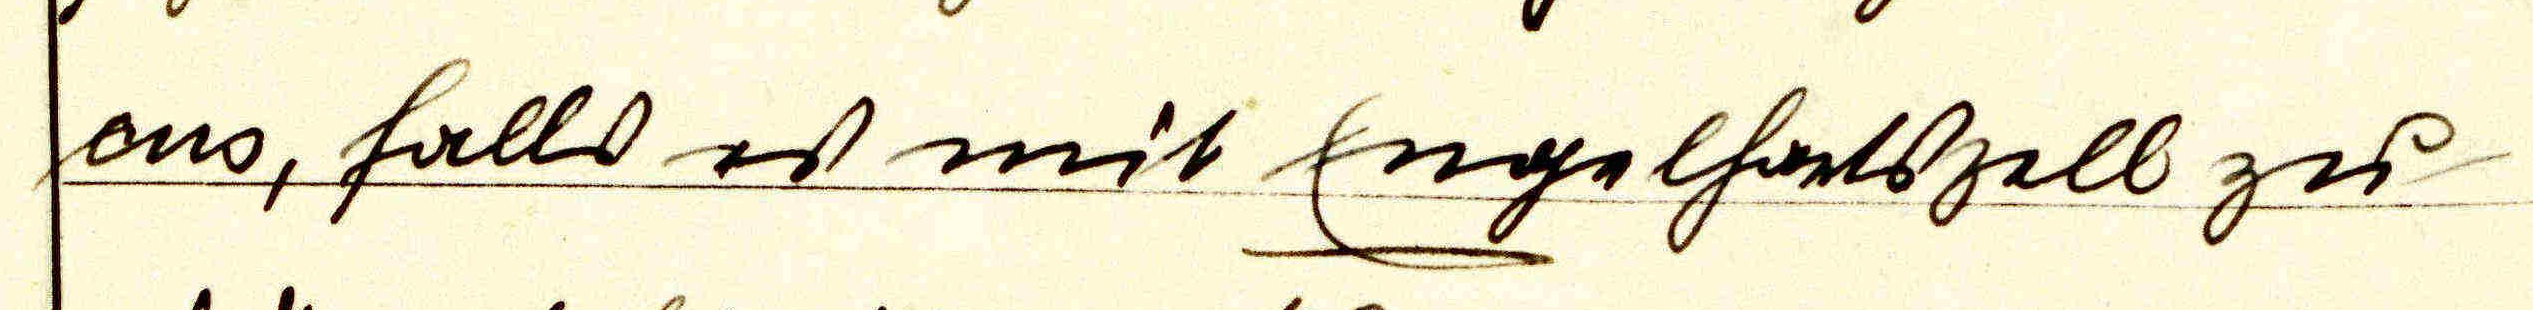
cus, falls es mit Engelhartszell zu
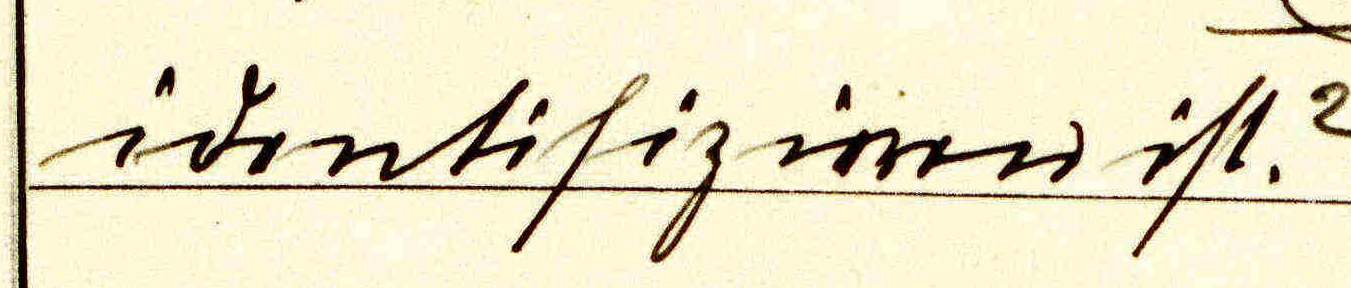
identifizieren ist?
